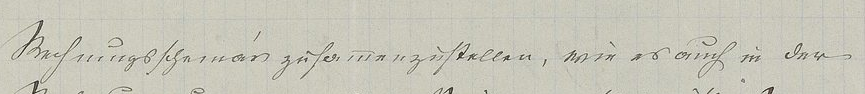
Rechnungsschema's zusammenzustellen, wie es auch in der
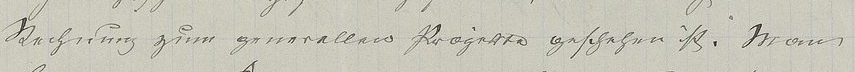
Rechnung zum generellen Projekte geschehen ist. Man
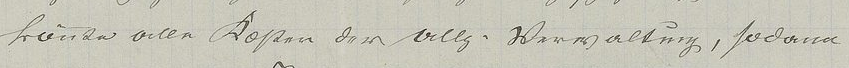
könnte alle Kosten der allg. Verwaltung, sodann
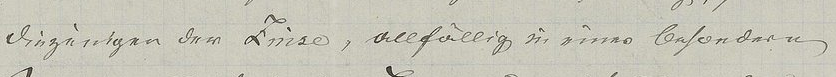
diejenigen der Zinse, allfällig in einer besondern
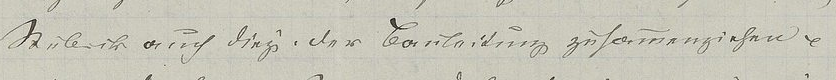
Rubrik auch diej. der Bauleitung zusammenziehen &
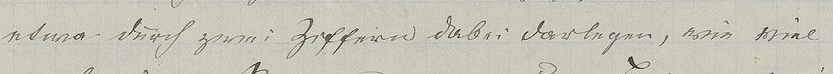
etwa durch zwei Ziffern dabei darlegen, wie viel
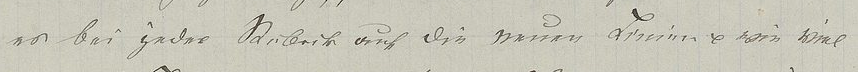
es bei jeder Rubrik auf die neuen Linien & wie viele
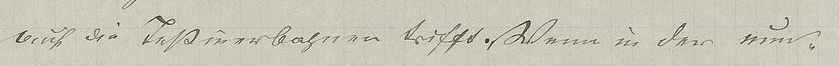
auf die Teßinerbahnen trifft. Wenn in der nun-
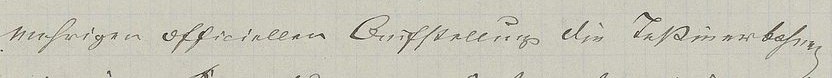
mehrigen offiziellen Aufstellung die Teßinerbahnen
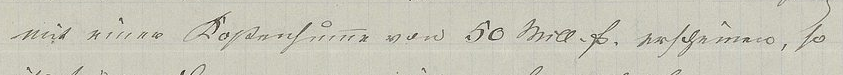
mit einer Kostensumme von 50 Mill. fs. erscheinen, so
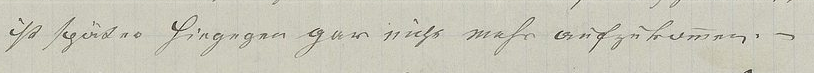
ist später hingegen gar nicht mehr aufzukommen. –
